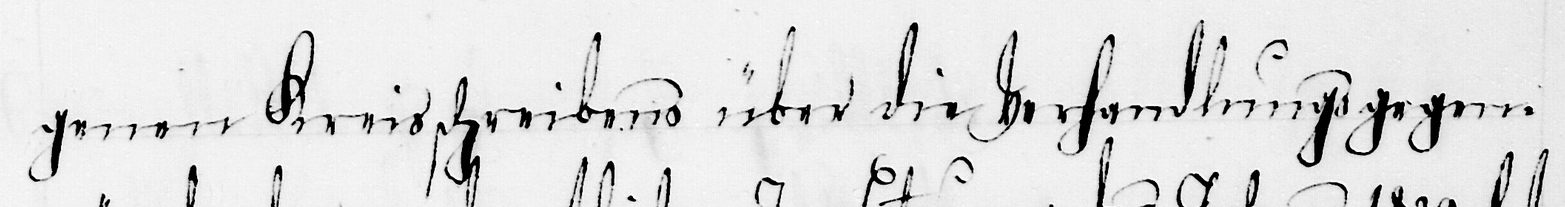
genen Kreisschreibens über die Verhandlungsgegen¬
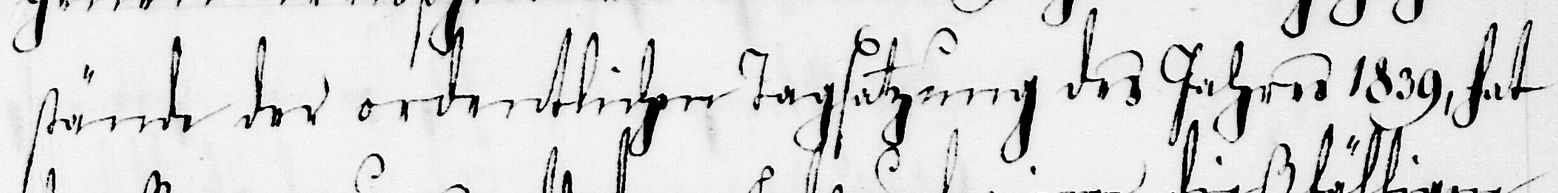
stände der ordentlichen Tagsatzung des Jahres 1839, hat
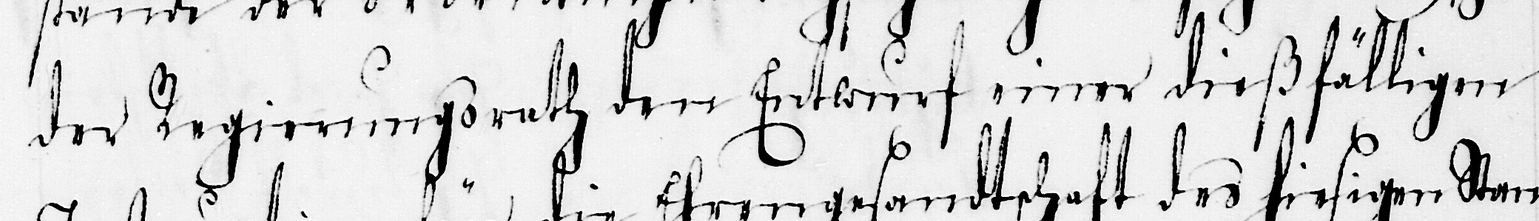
der Regierungsrath den Entwurf einer dießfälligen
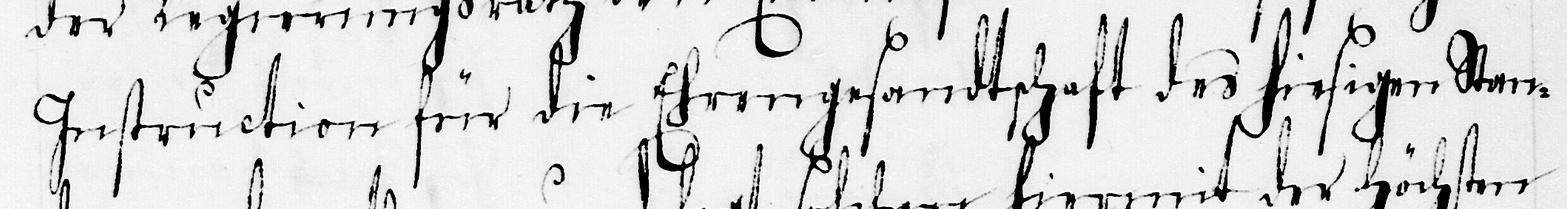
Instruction für die Ehrengesandtschaft des hiesigen Stan¬
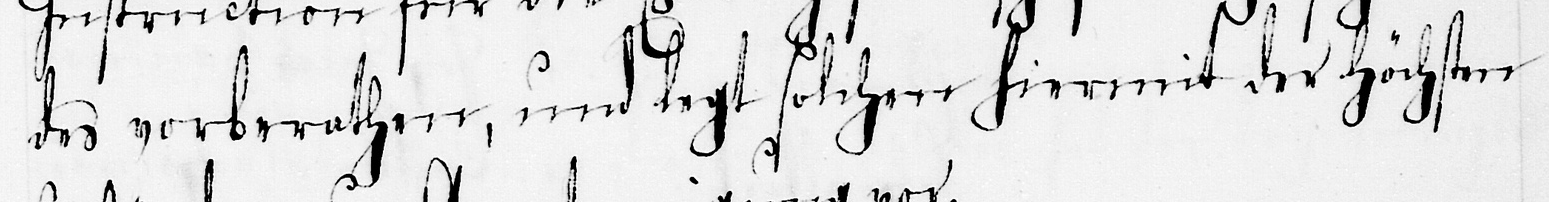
des vorberathen, und legt solchen hiermit der Höchsten
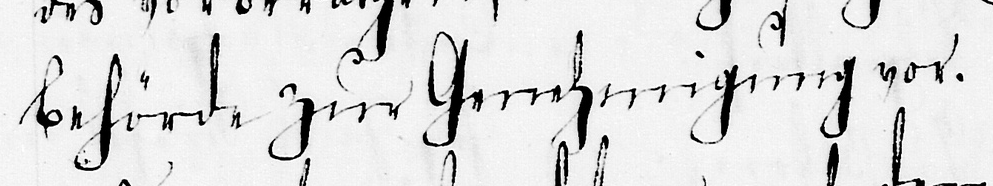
Behörde zur Genehmigung vor.
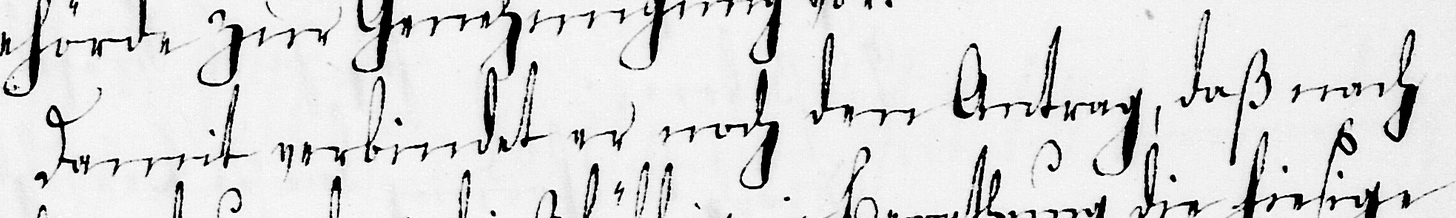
Damit verbindet er noch den Antrag, daß nach
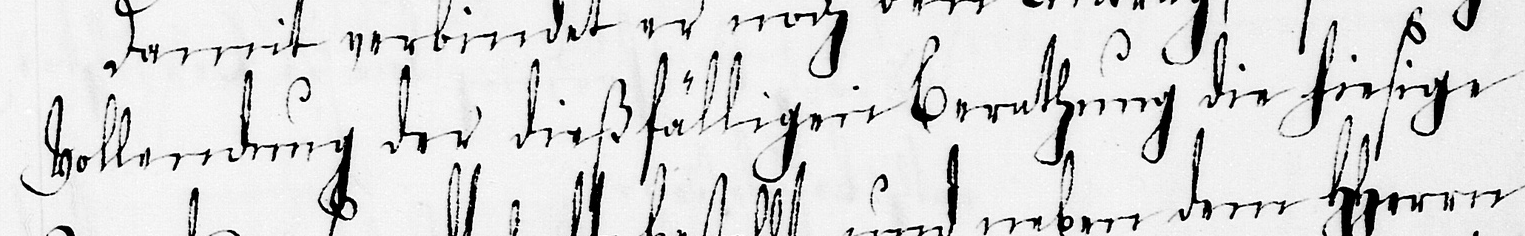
Vollendung der dießfälligen Berathung die hiesige
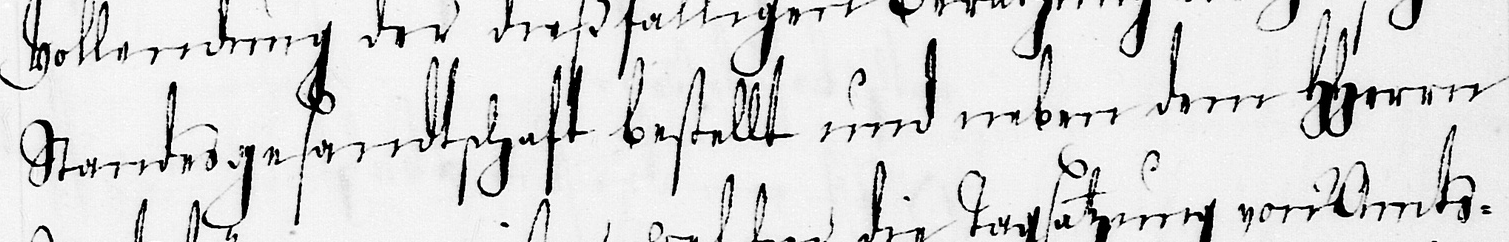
Standesgesandtschaft bestellt und neben dem HHerrn
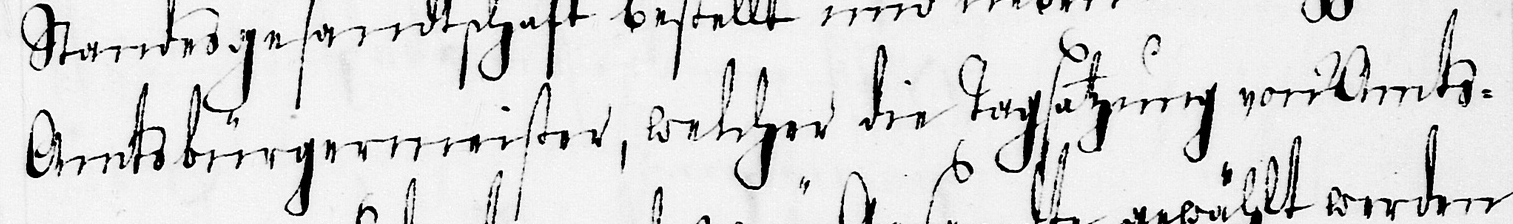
Amtsbürgermeister, welcher die Tagsatzung von Amts¬
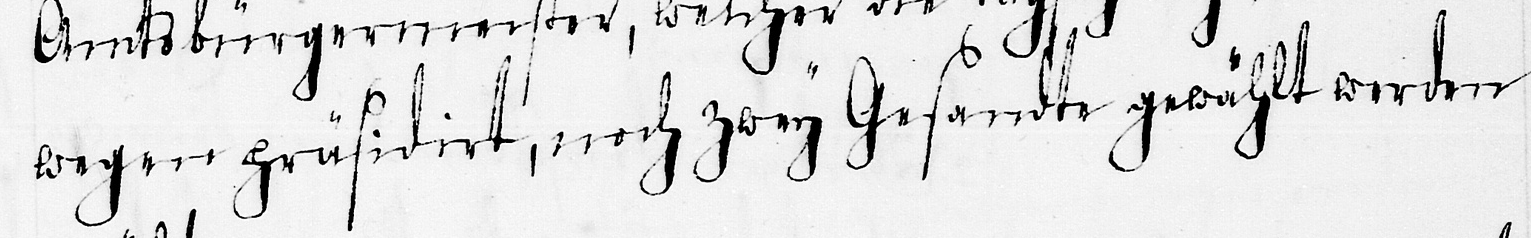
wegen präsidirt, noch zwey Gesandte gewählt werden
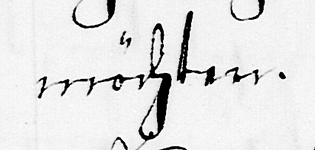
möchten.
